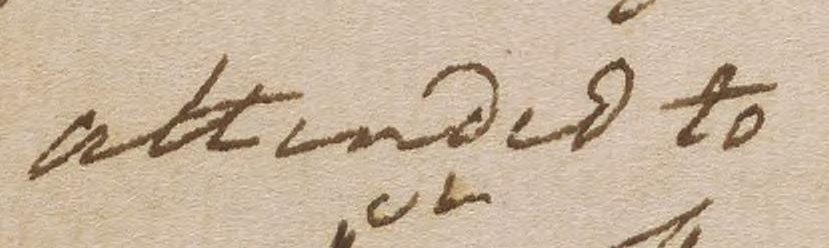attended to
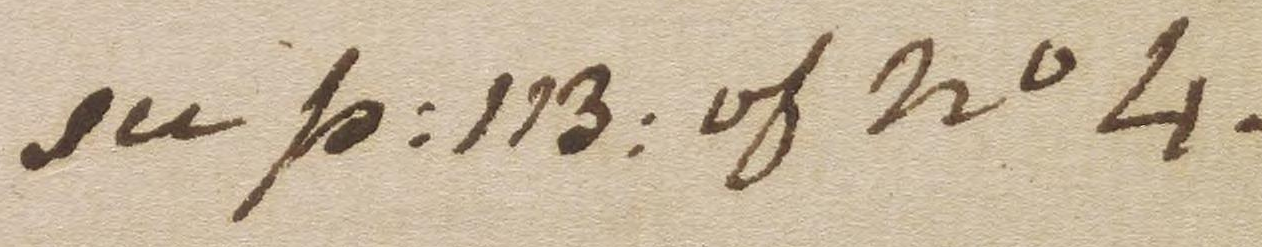see p. 133 of N^o 4
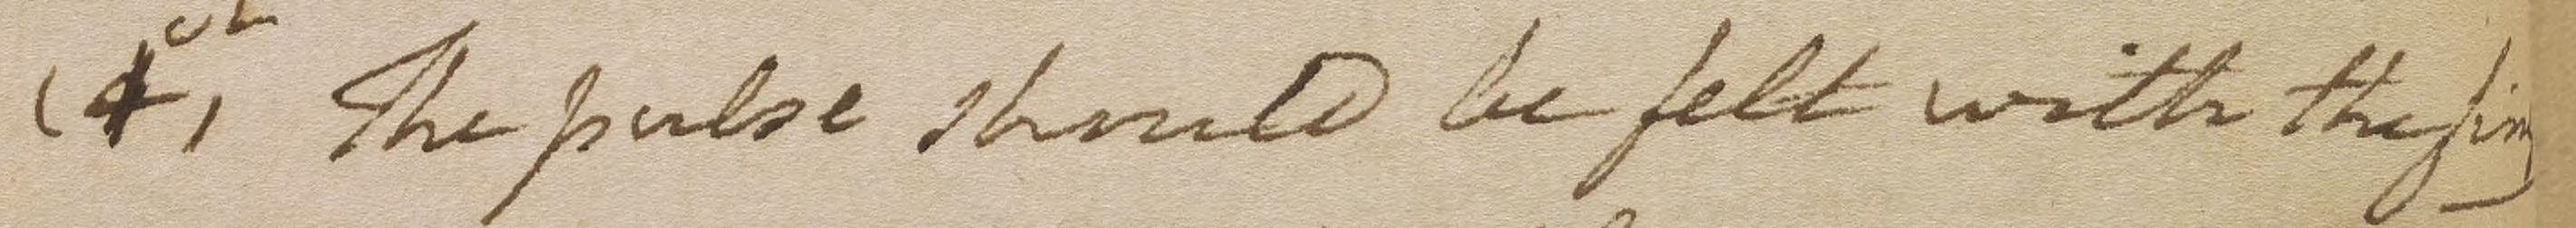(4) The pulse should be felt with the finger
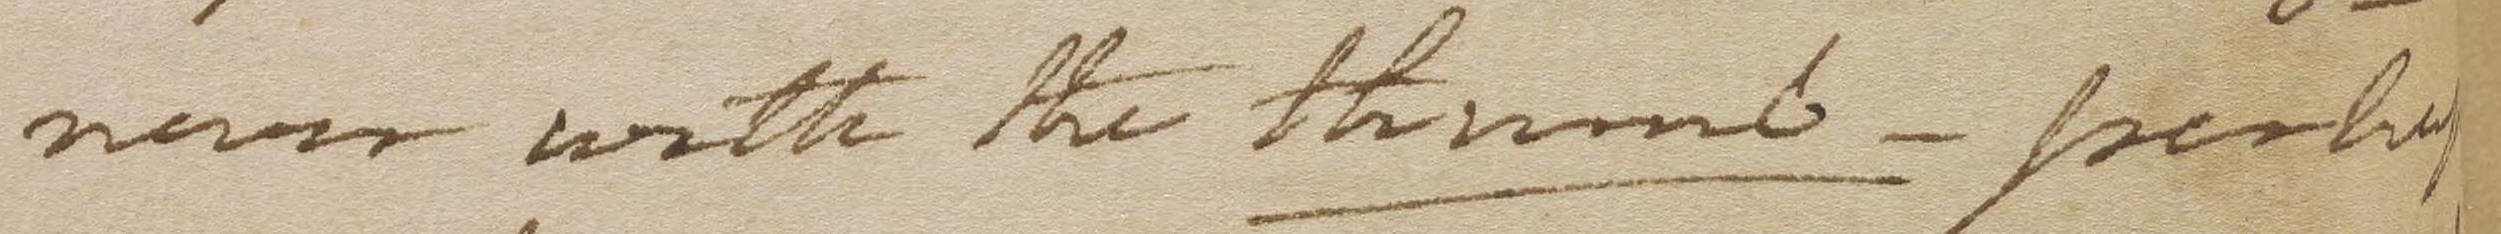never with the thumb, perhaps
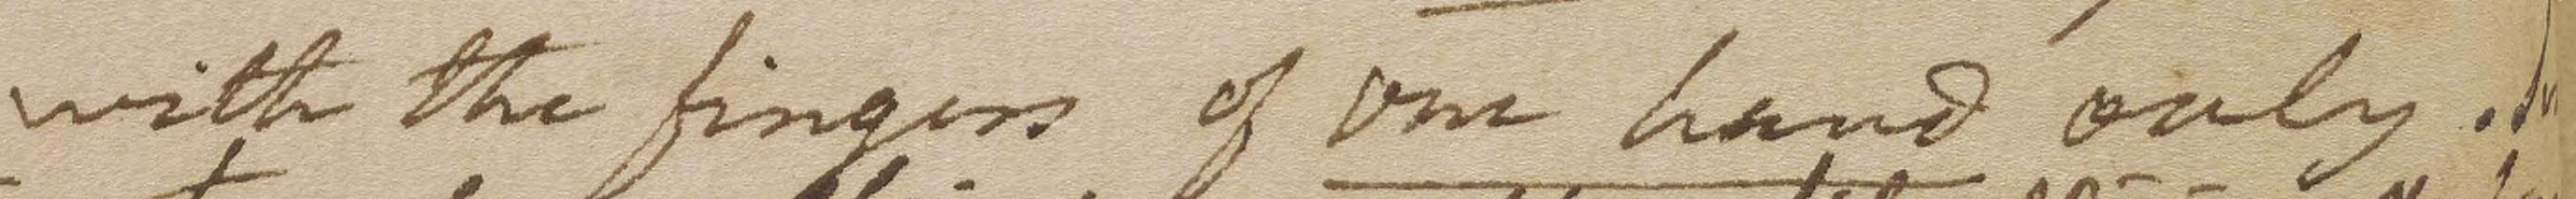with the fingers of one hand only
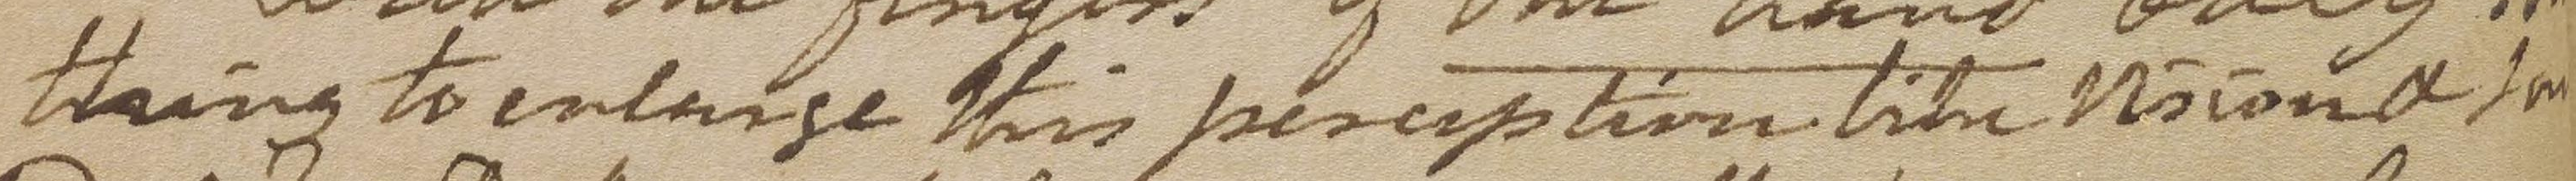-thing to enlarge this perception like vision & Im
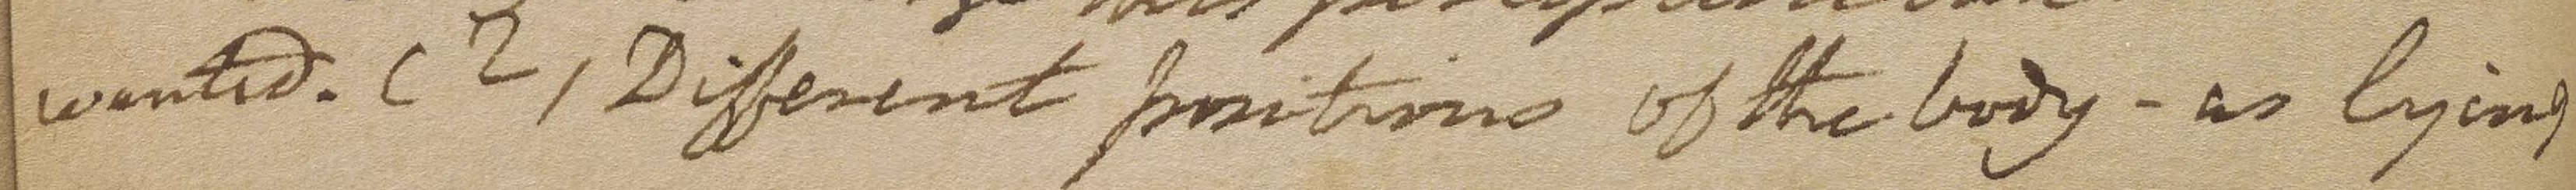wanted. (2) Different positions of the body, as lying
